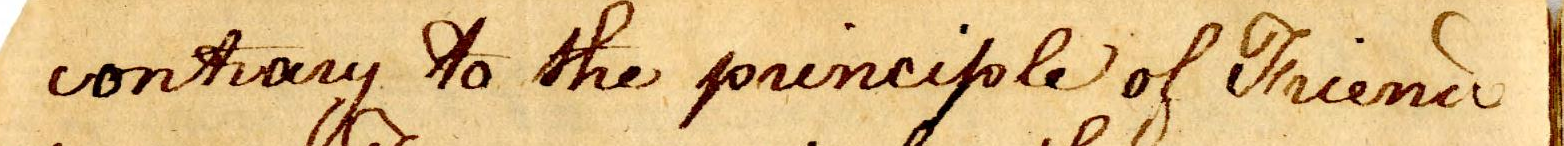contrary to the principle of Friend
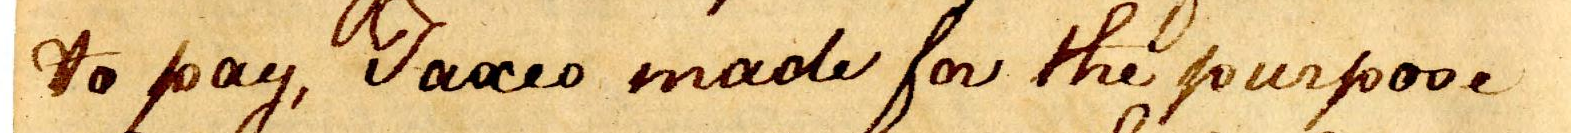to pay, Taxes made for the purpose
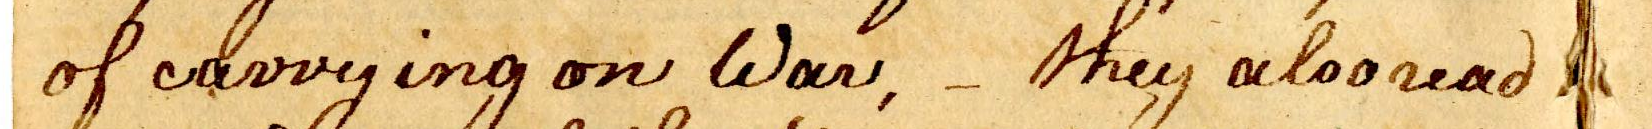of carrying on War,- they absoread &
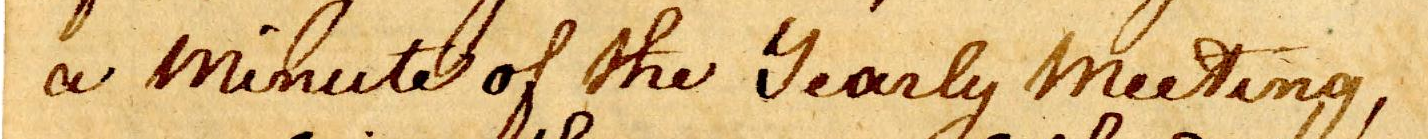a Minute of the Yearly Meeting,
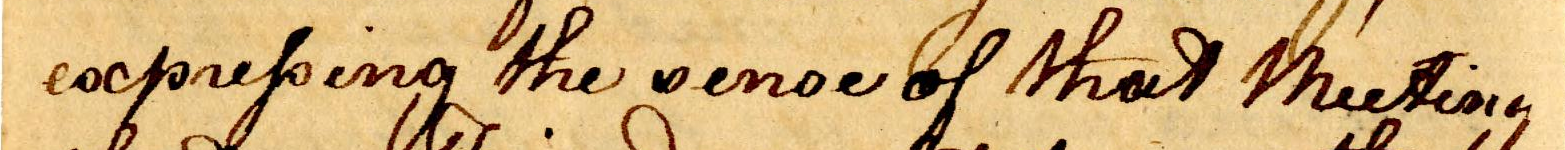expressing the sense of that Meeting
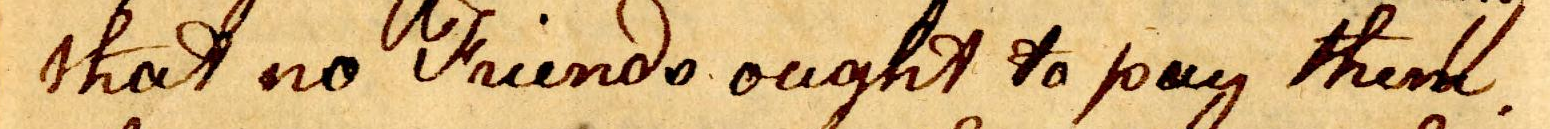that no Friends ought to pay them.
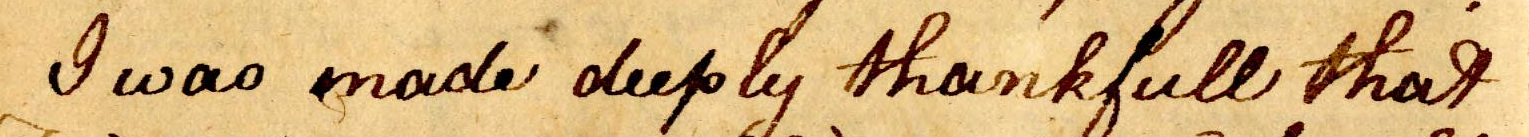I was made deeply thankfull that
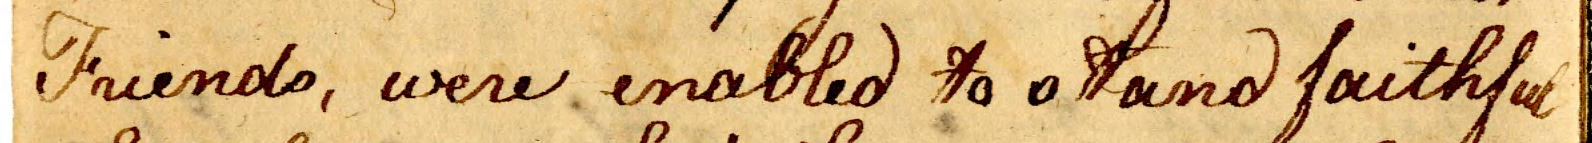Friends, were enabled to stand faithful
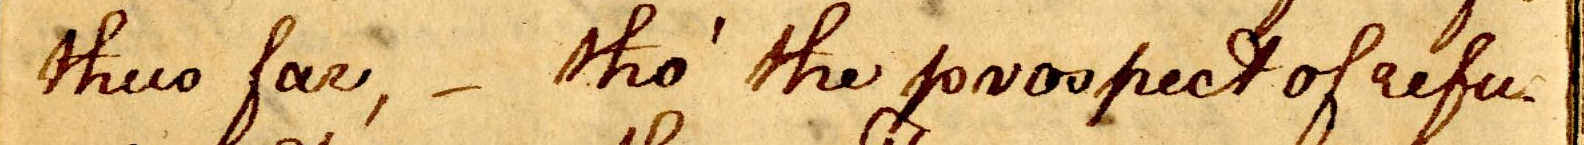thus far- tho' the prospect of refu-
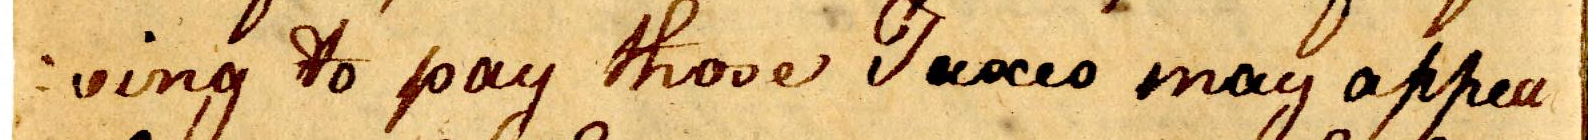-sing to pay those Taxes may appea
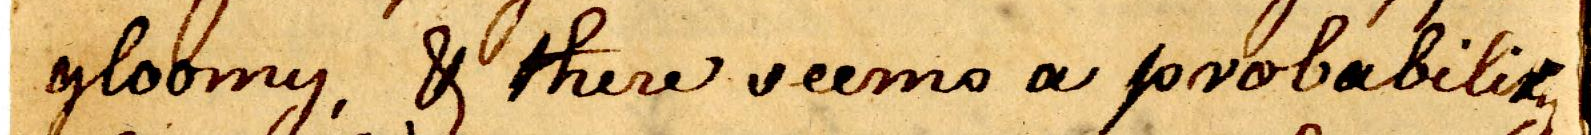gloomy, & there seems a probability
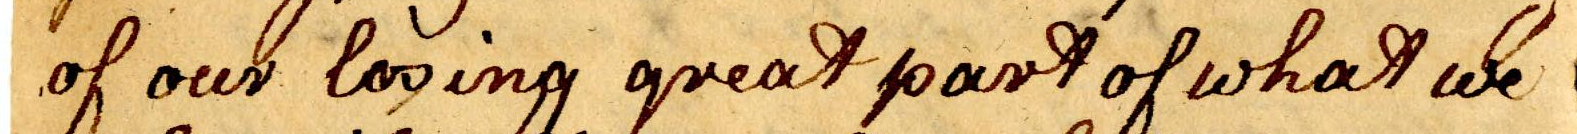of our losing great part of what we
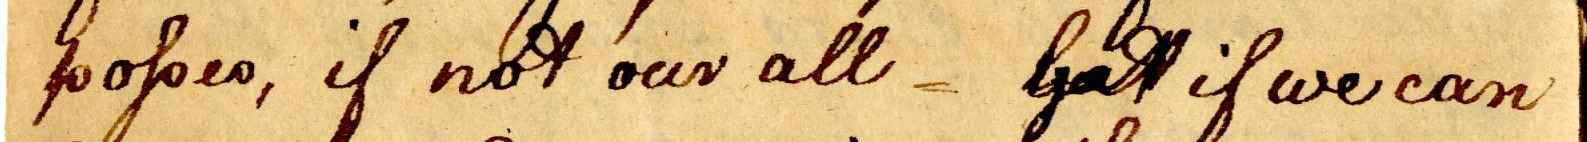posses, if not our all- [yet] if we can
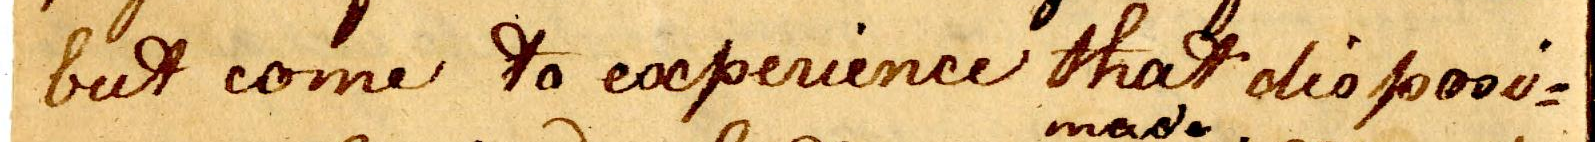but come to experience that disposi-
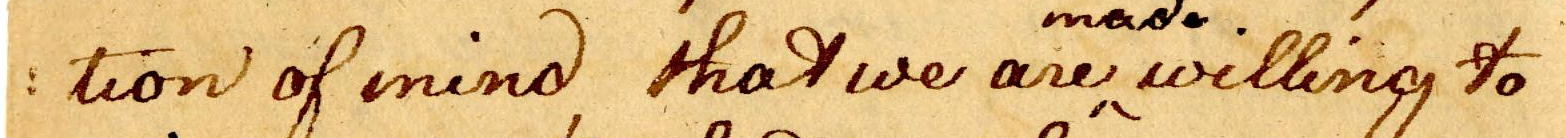-tion of mind that we are ^ willing to
